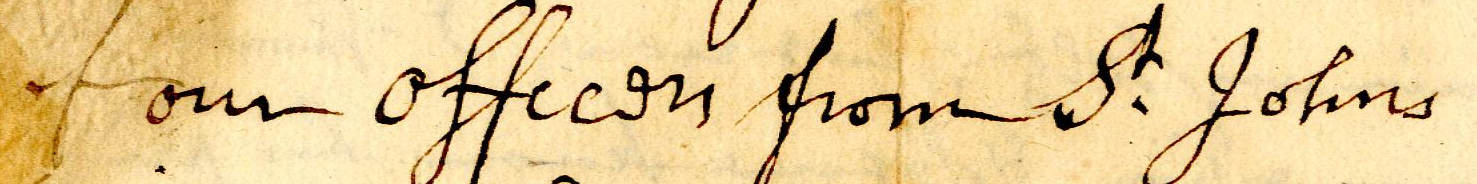four officers from S.^t Johns
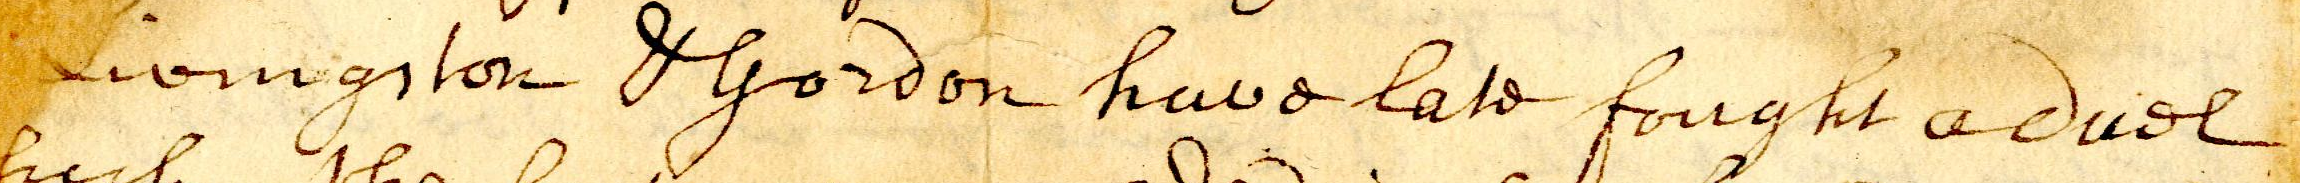Livingston & Gordon have late fought a duel
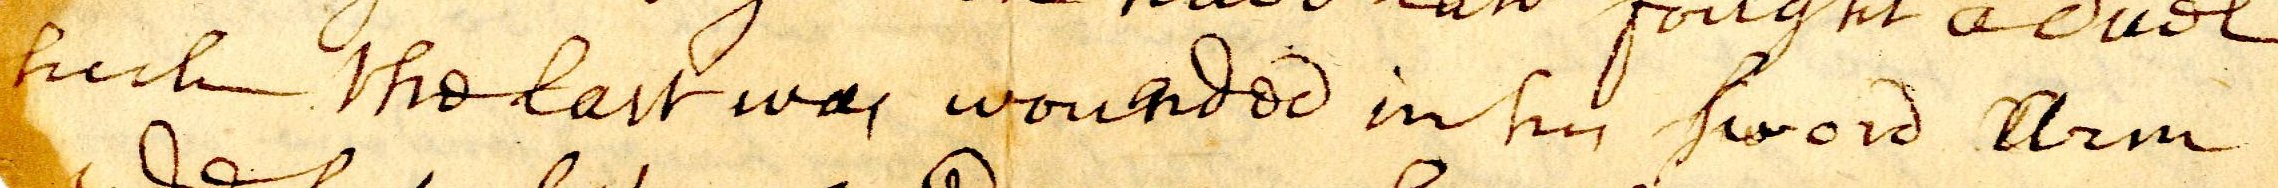herb the last was wounded in his sword Arm
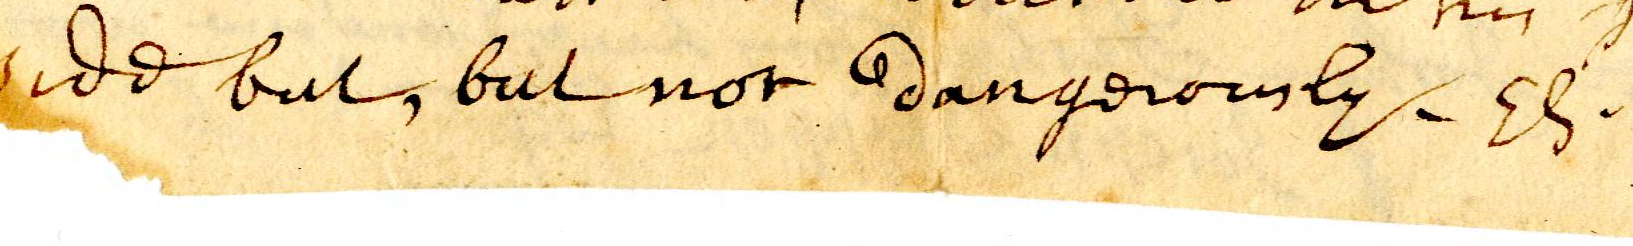side but, but nor dangerously- ES-
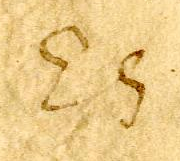ES
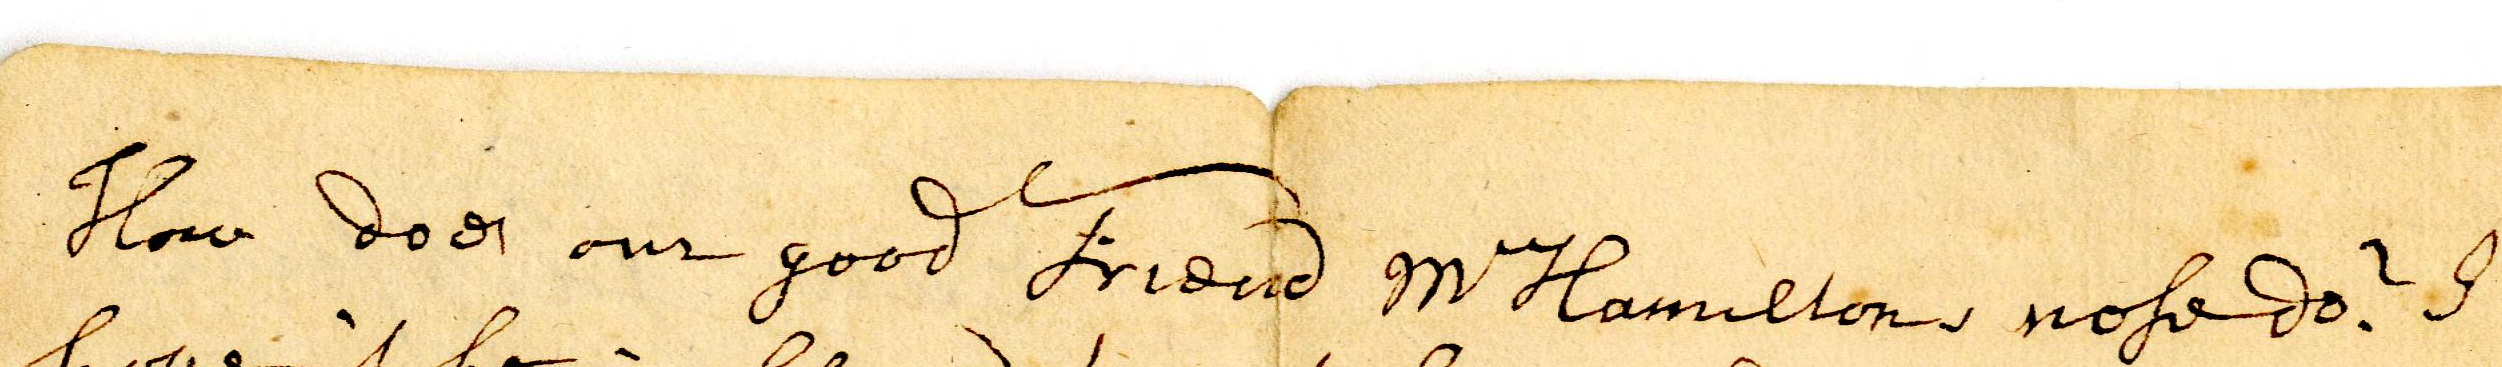How does our good Friend M^r Hamiltons nose do? I
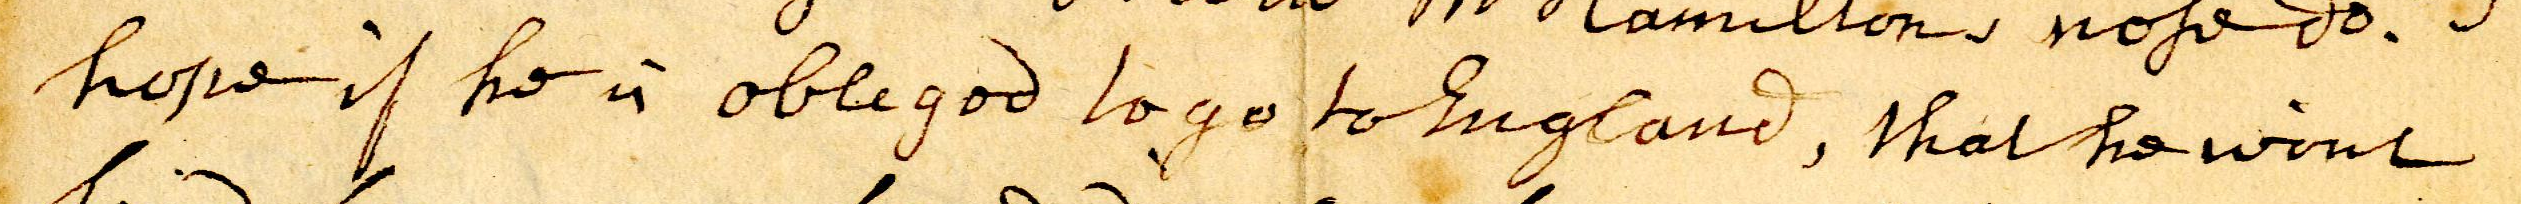hope if he is obliged to go to England, that he won't
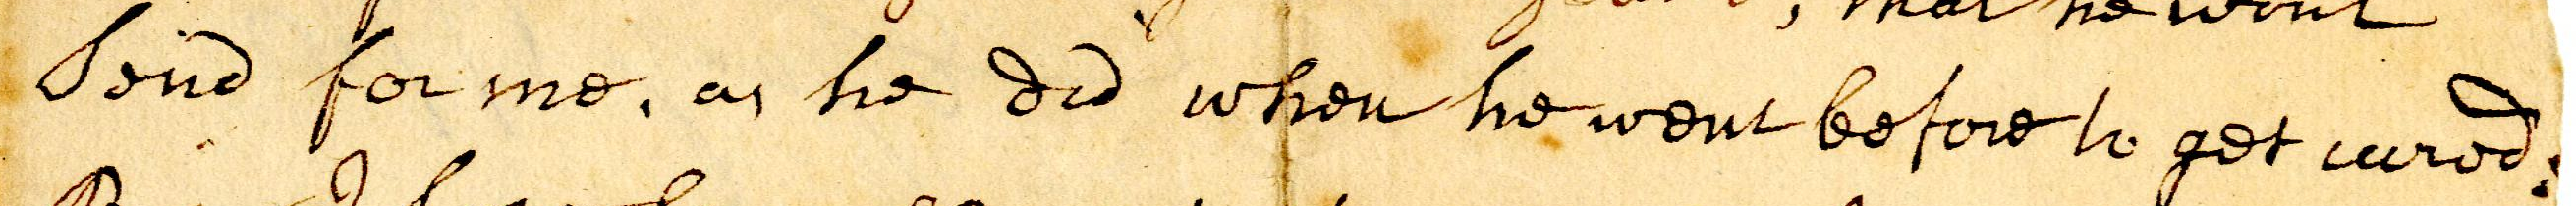send for me, as he did when he went before h. got wrod:
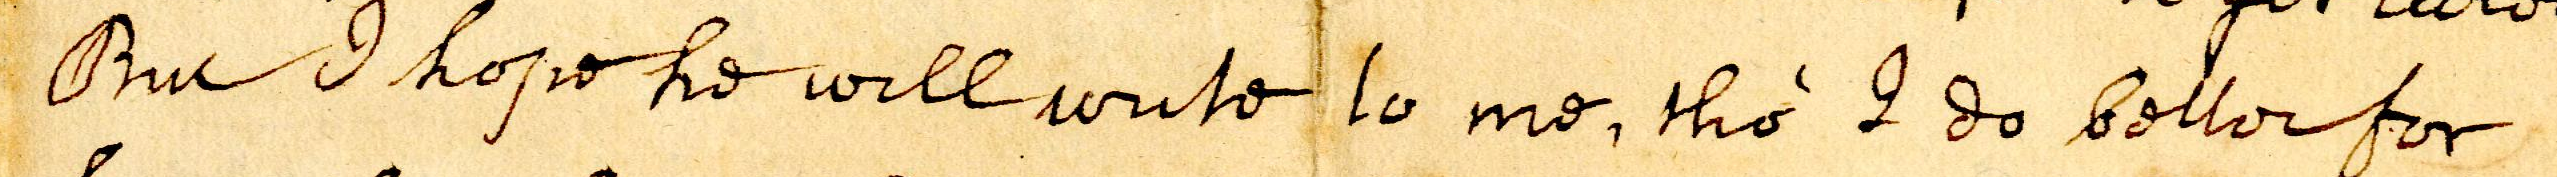But I hope he will write to me, tho' I do better for
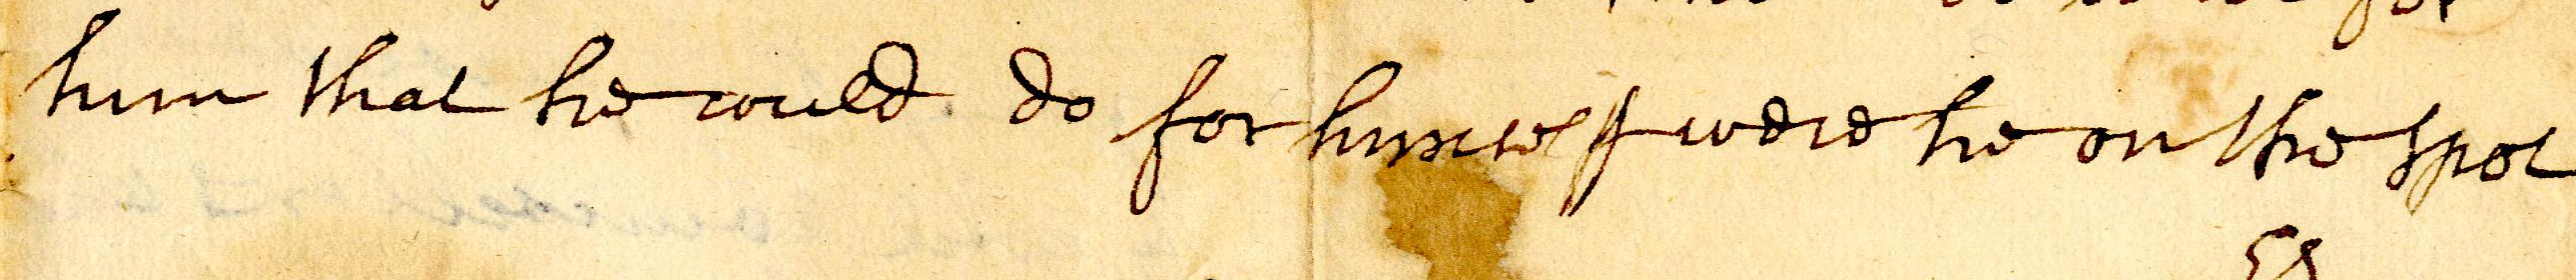him that he could do for himself & were he on the spot
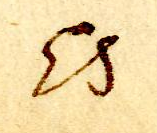ES
